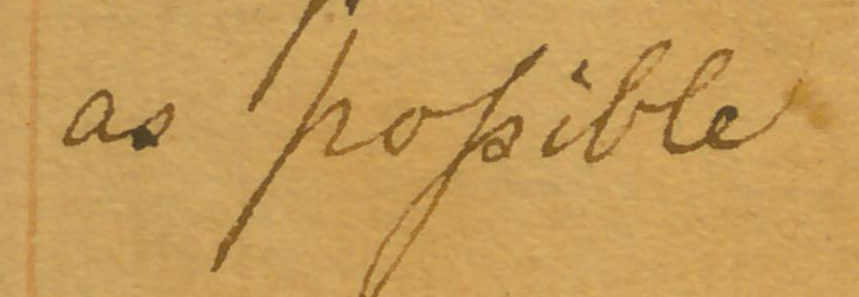as possible
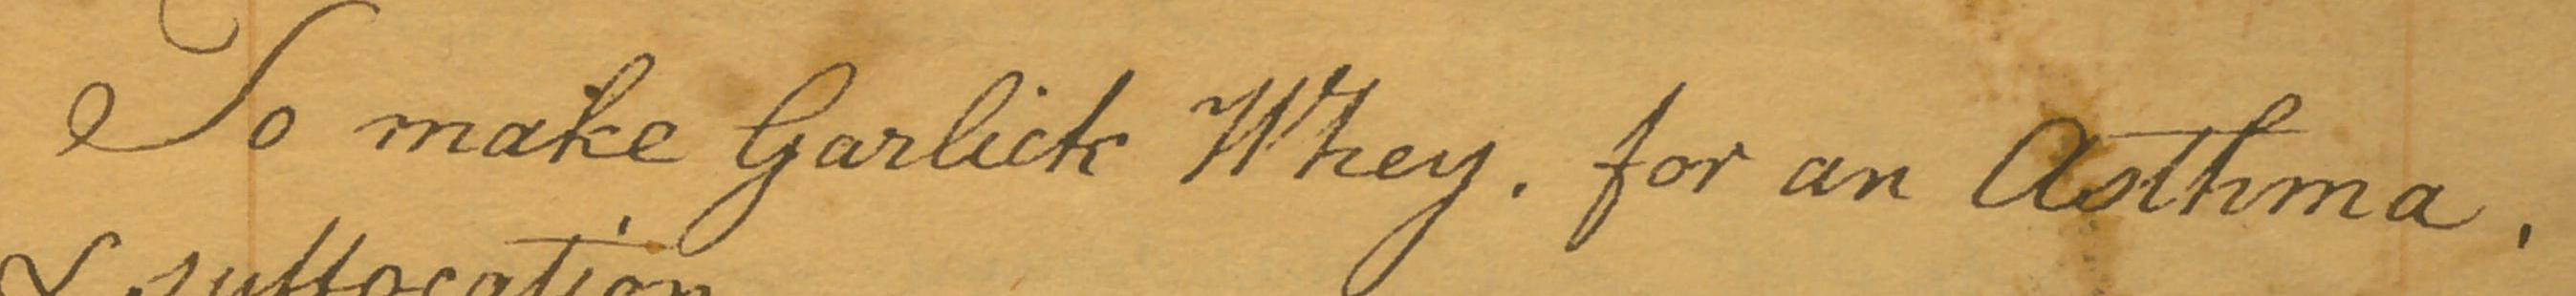To make Garlick Whey. for an Asthma.
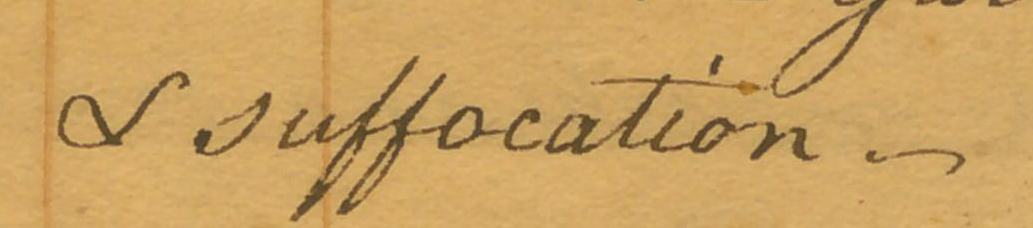& suffocation
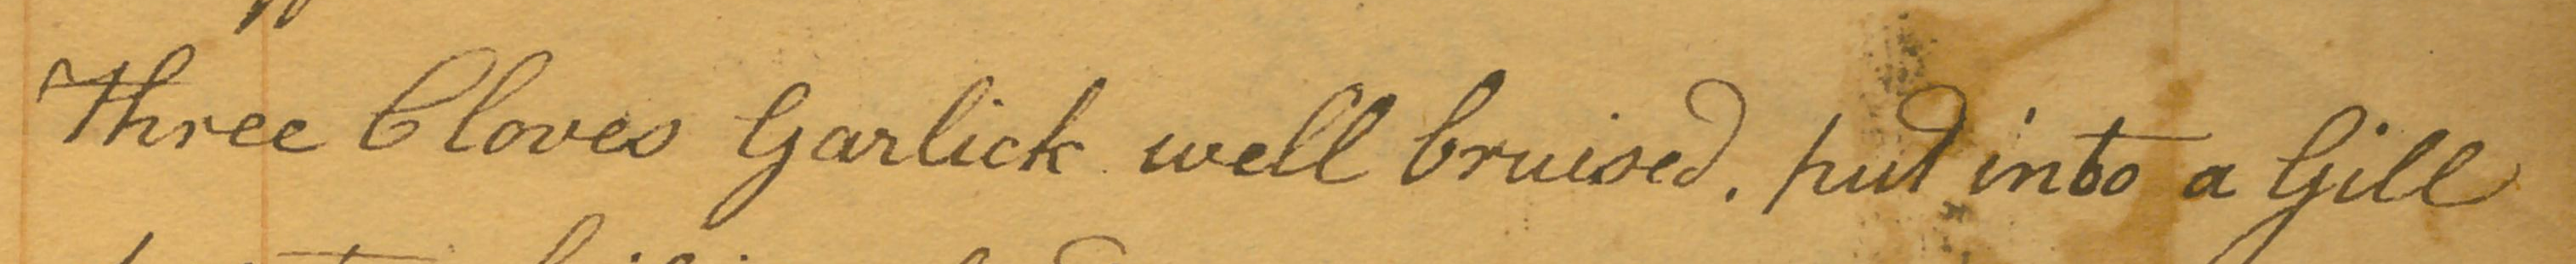Three Cloves Garlick well bruised. put into a Gill
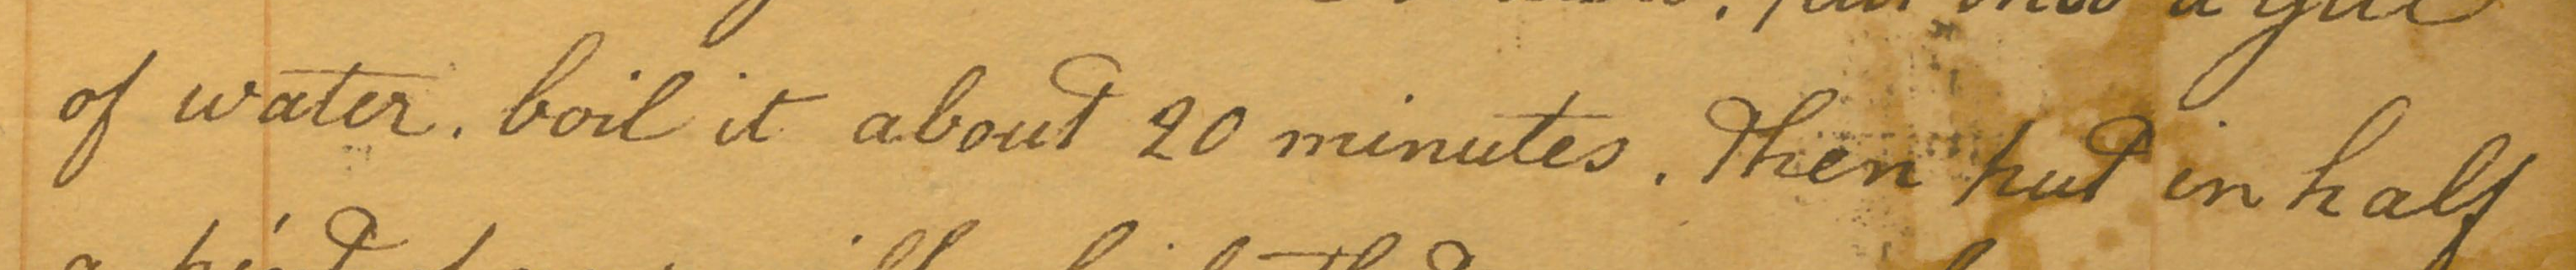of water. boil it about 20 minutes. Then put in half
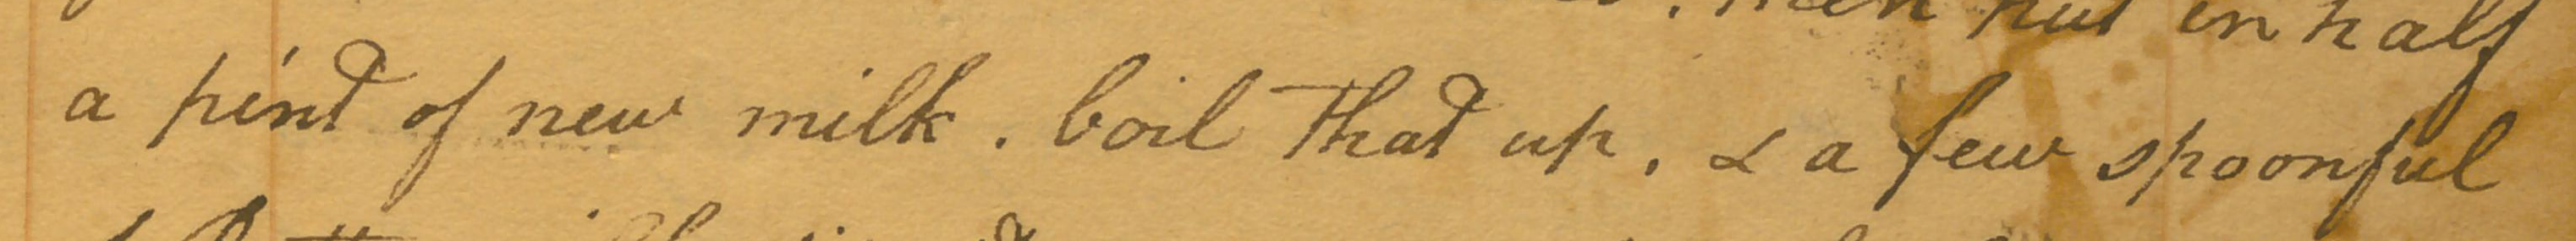a pint of new milk. boil that up, & a few spoonful
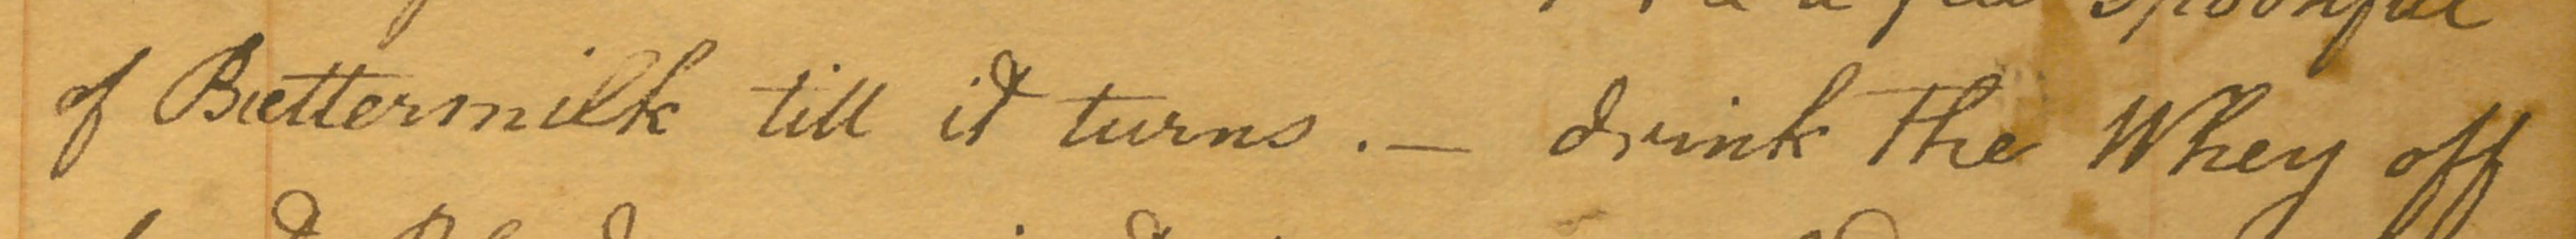of Buttermilk till it turns.- drink the Whey off
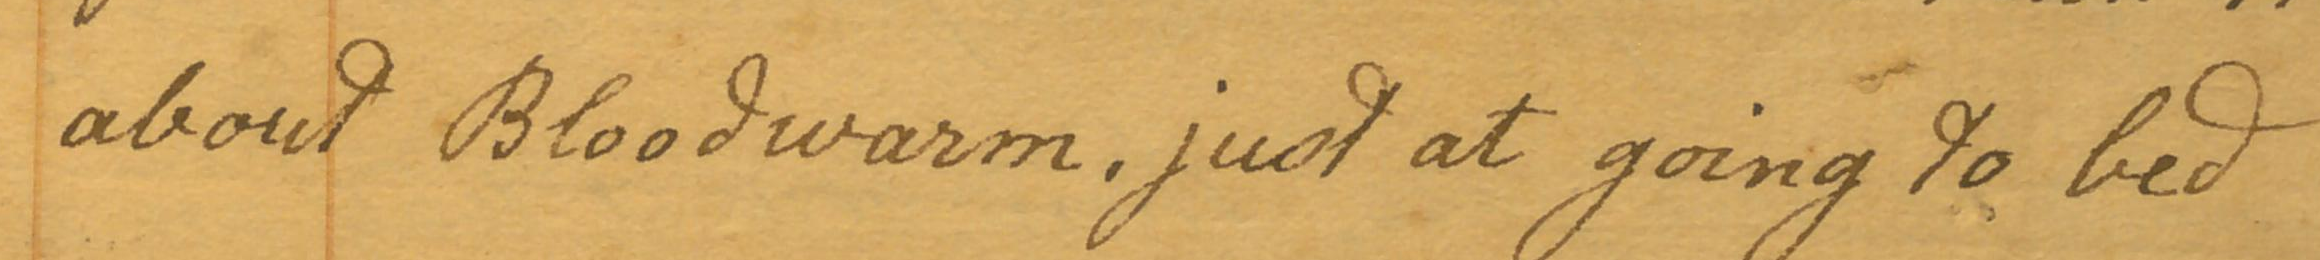about Bloodwarm, just at going to bed
